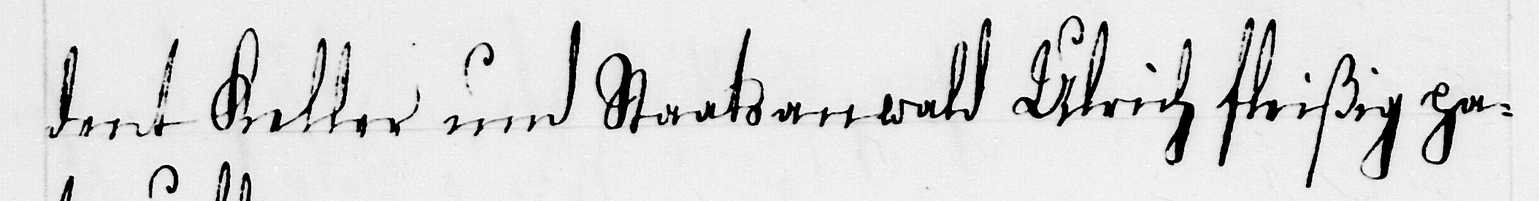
dent Keller und Staatsanwald Ulrich fleißig pa¬
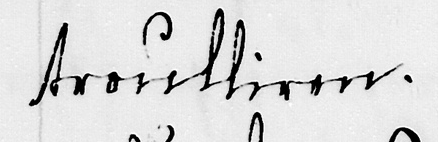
troulliren.
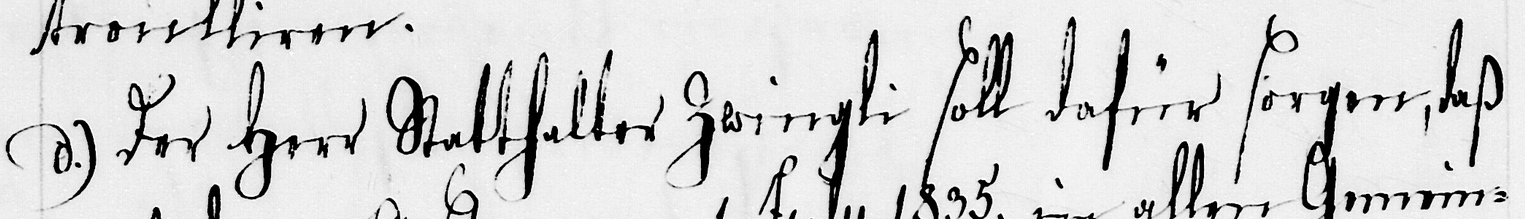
d.) Der Herr Statthalter Zwingli soll dafür sorgen, daß
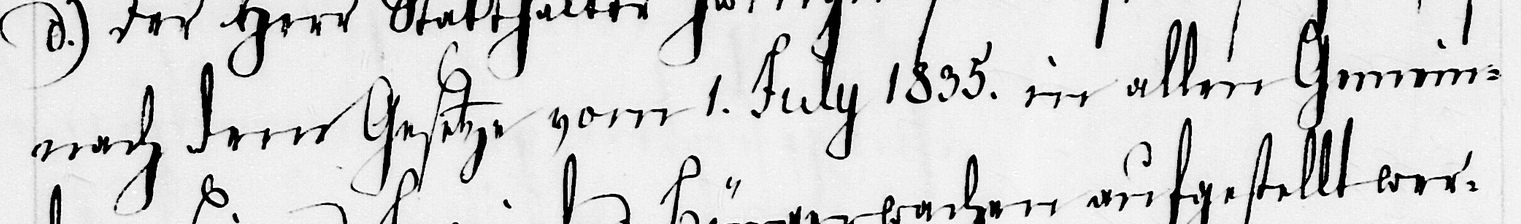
nach dem Gesetze vom 1. July 1835. in allen Gemein¬
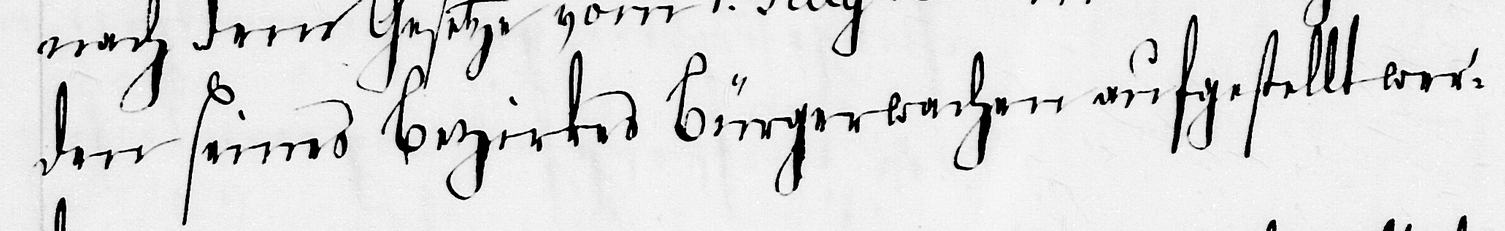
den seines Bezirkes Bürgerwachen aufgestellt wer¬
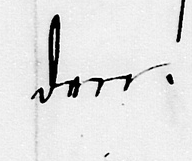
den.
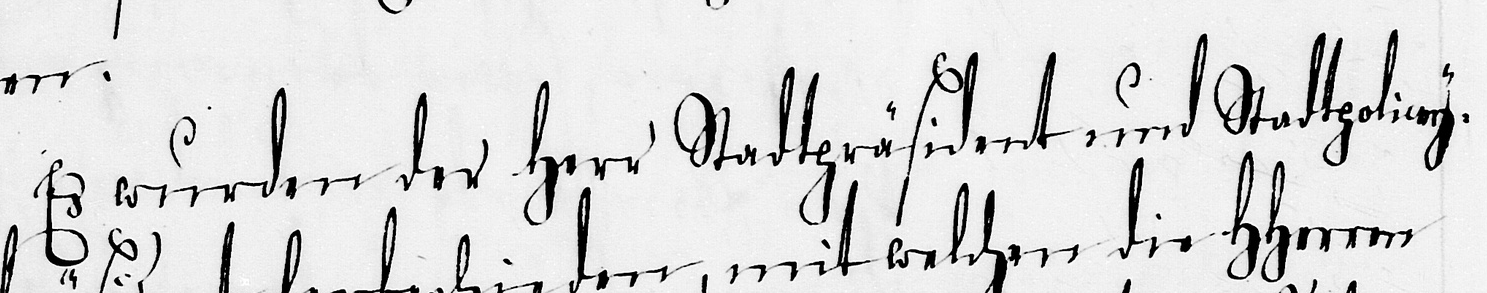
Es wurden der Herr Stadtpräsident und Stadtpolic¬
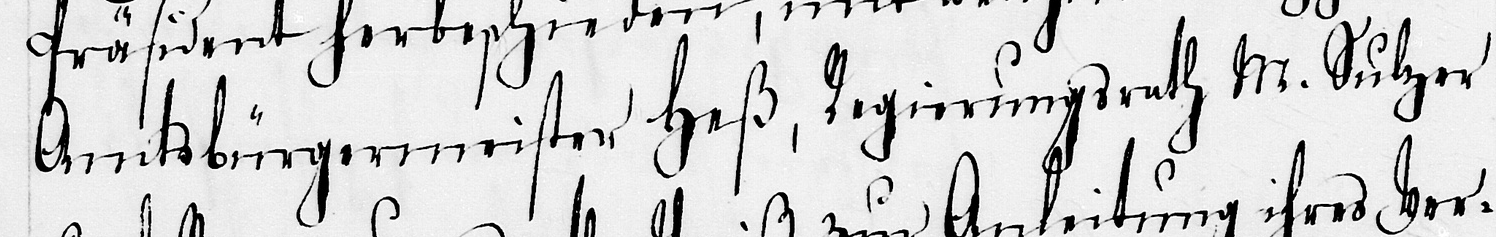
Amtsbürgermeister Heß, Regierungsrath M. Sulzer
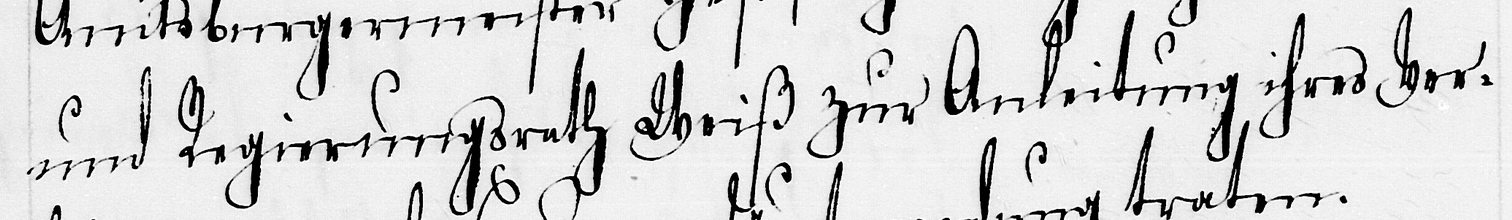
und Regierungsrath Weiß zur Anleitung ihres Ver¬
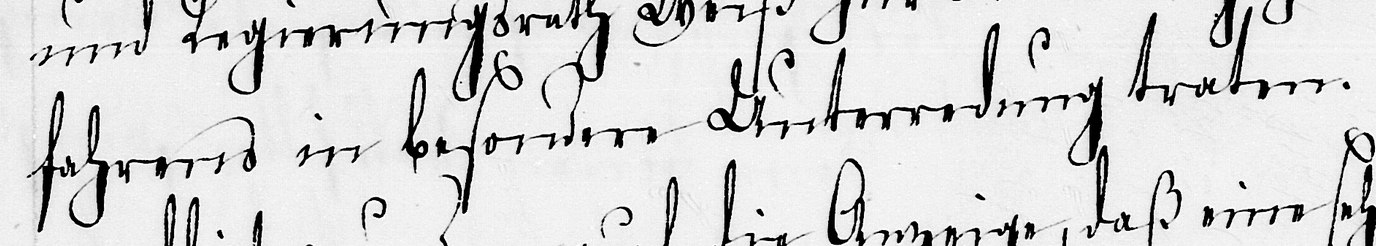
fahrens in besondere Unterredung traten.
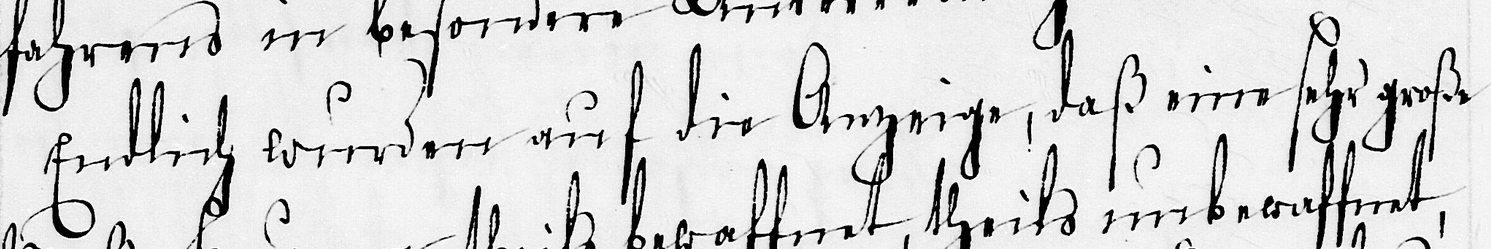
Endlich wurden auf die Anzeige, daß eine sehr große
